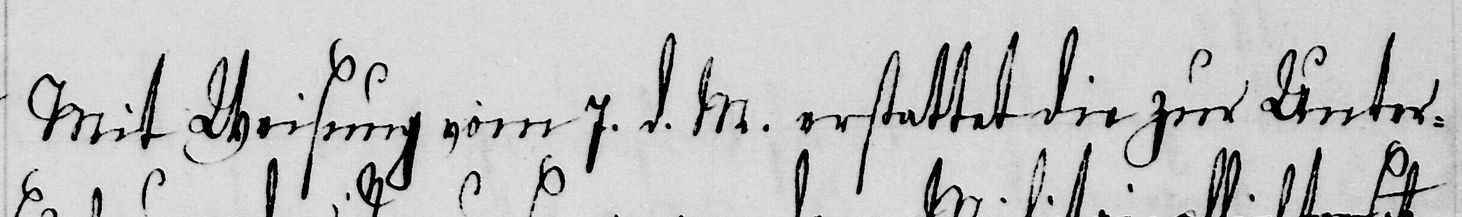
Mit Weisung vom 7. d. M. erstattet die zur Unter¬
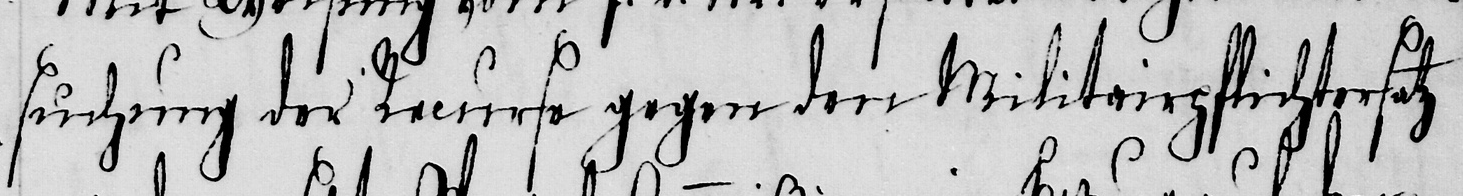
suchung der Recurse gegen den Militairpflichtersatz
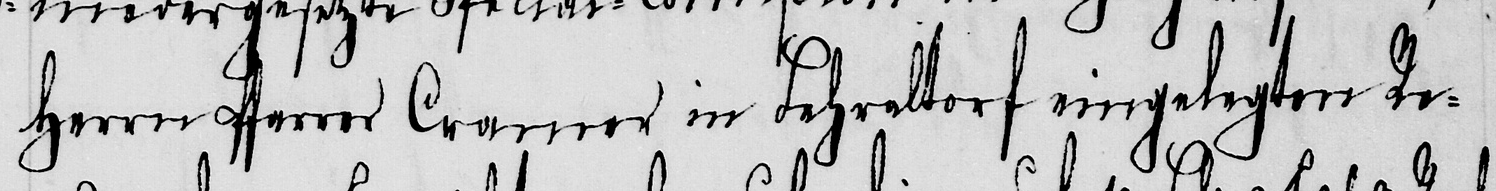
Herrn Pfarrer Cramer in Fehraltorf eingelegten Re¬
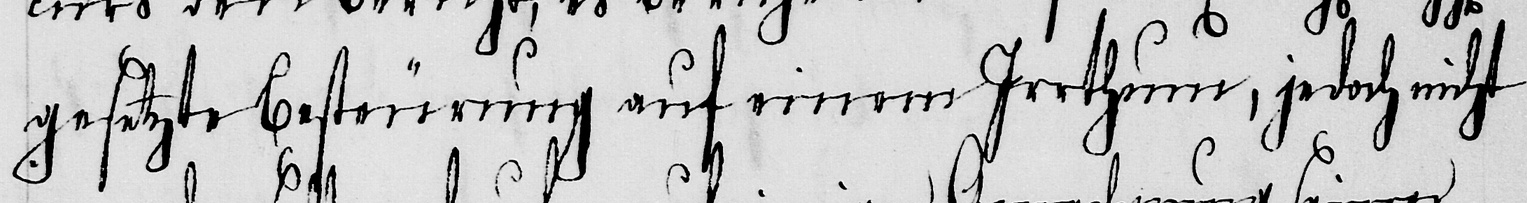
gesetzte Besteuerung auf einem Irrthum, jedoch nicht
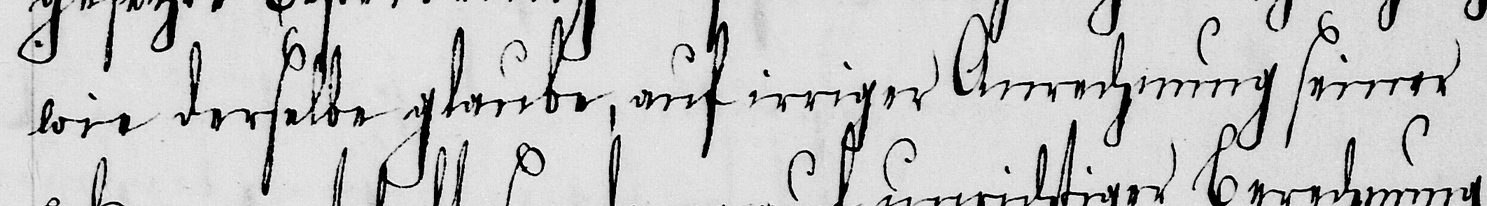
wie derselbe glaube, auf irriger Anrechnung seiner
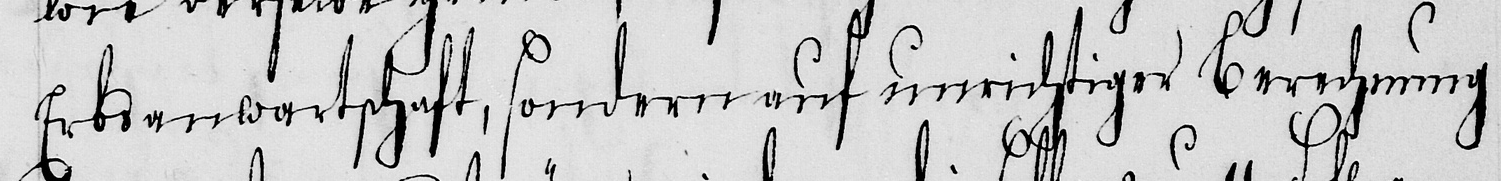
Erbsanwartschaft, sondern auf unrichtiger Berechnung
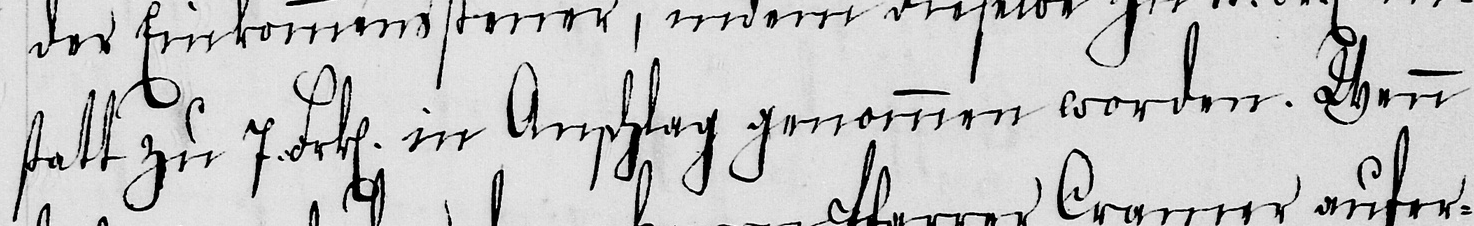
tatt zu 7. Frk[en]. in Anschlag genommen worden. Wenn
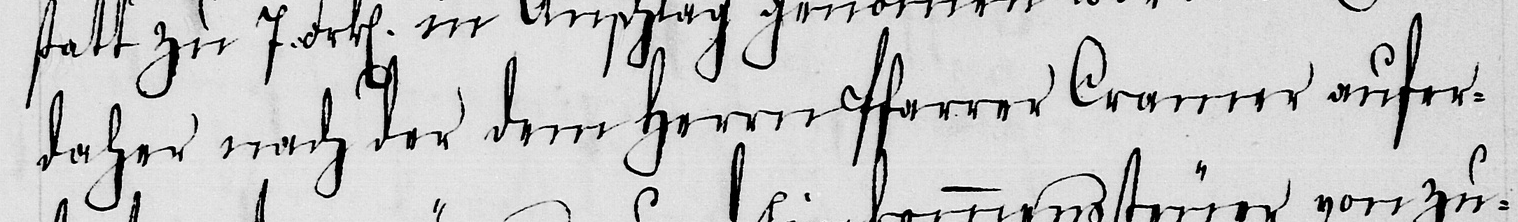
daher nach der dem Herrn Pfarrer Cramer aufer¬
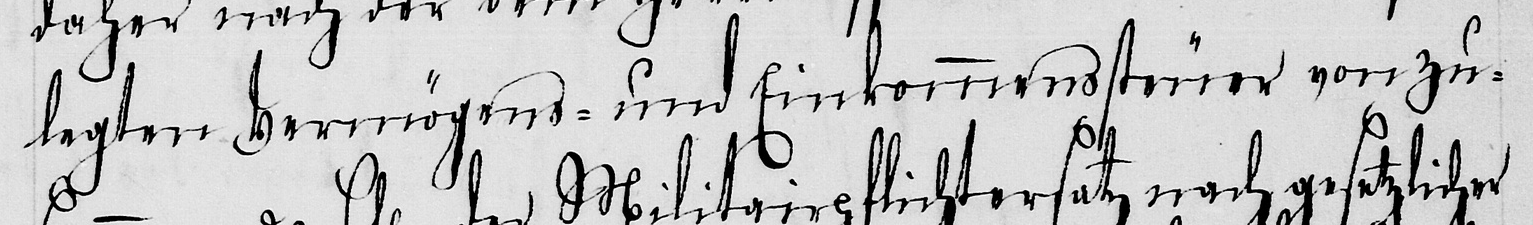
legten Vermögens- und Einkommenssteuer von zu¬
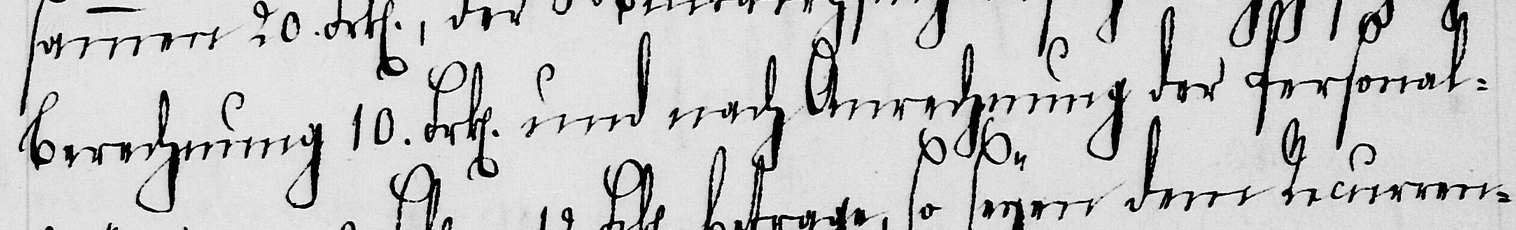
Berechnung 10. Frk[en]. und nach Anrechnung der Personal¬
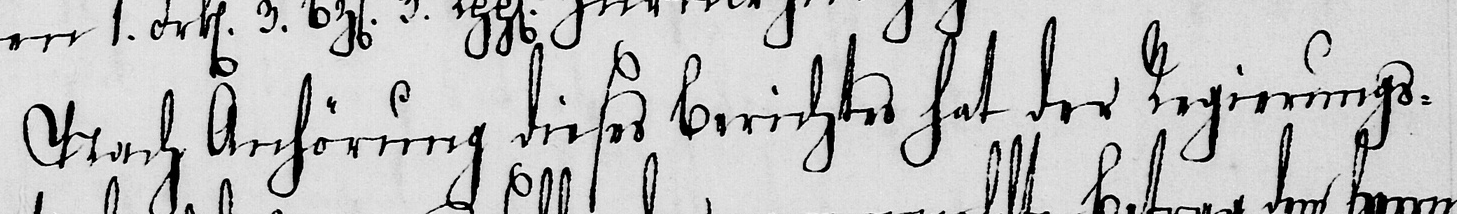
Nach Anhörung dieses Berichtes hat der Regierungs¬
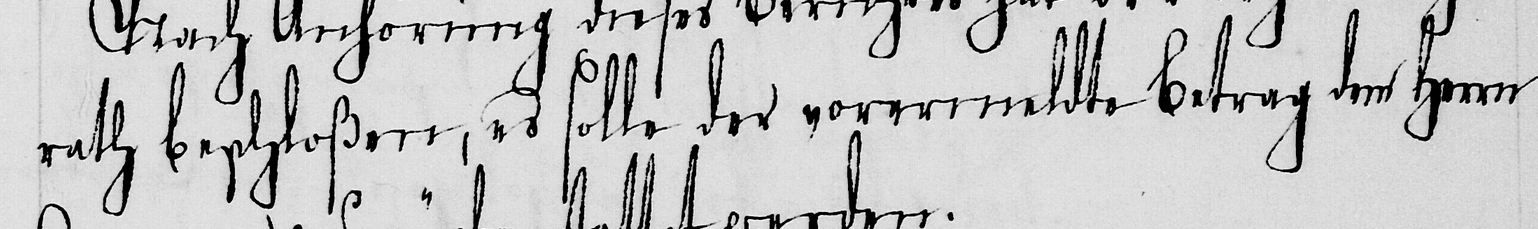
rath beschloßen, es solle der vorermeldte Betrag dem Her¬
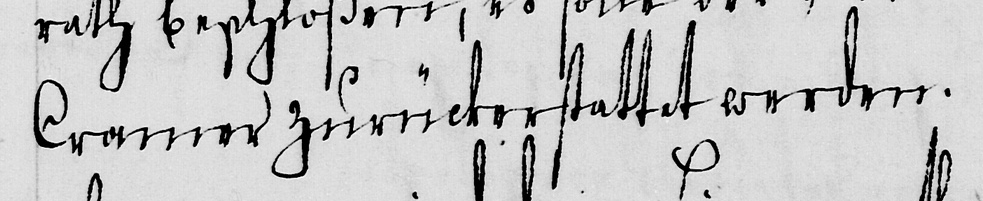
Cramer zurückerstattet werden.
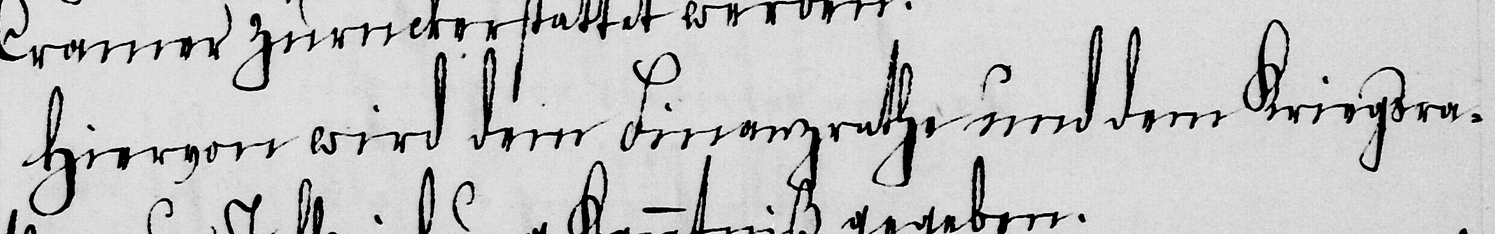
Hiervon wird dem Finanzrathe und dem Kriegsra¬
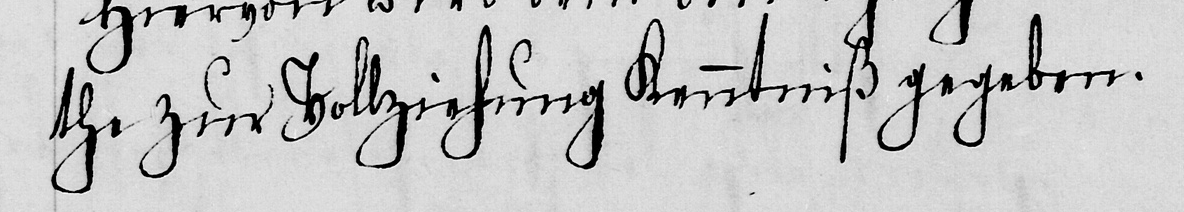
the zur Vollziehung Kenntniß gegeben.
